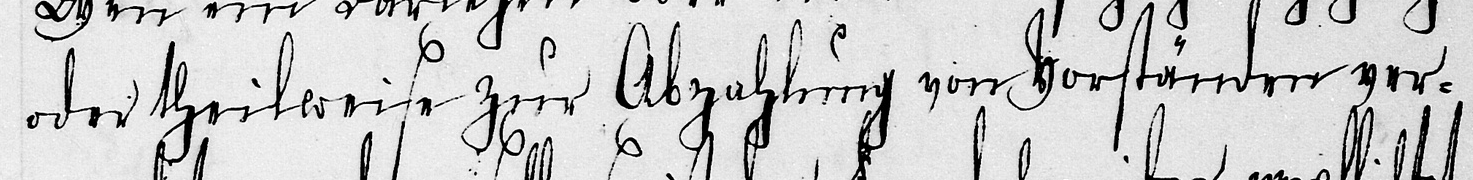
oder theilweise zur Abzahlung von Vorständen ver¬
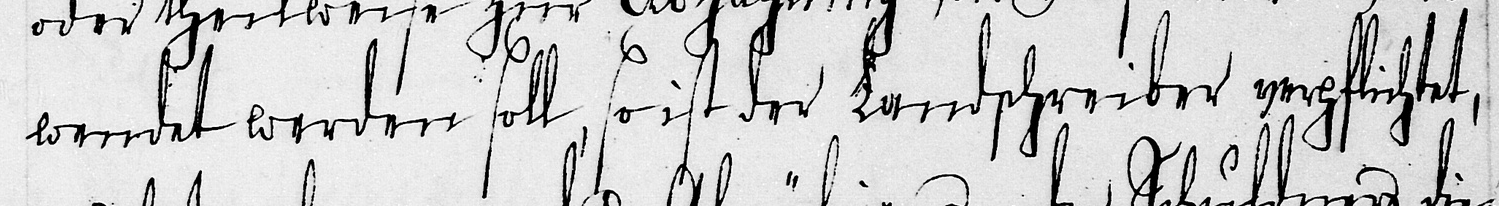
wendet werden soll, so ist der Landschreiber verpflicht¬
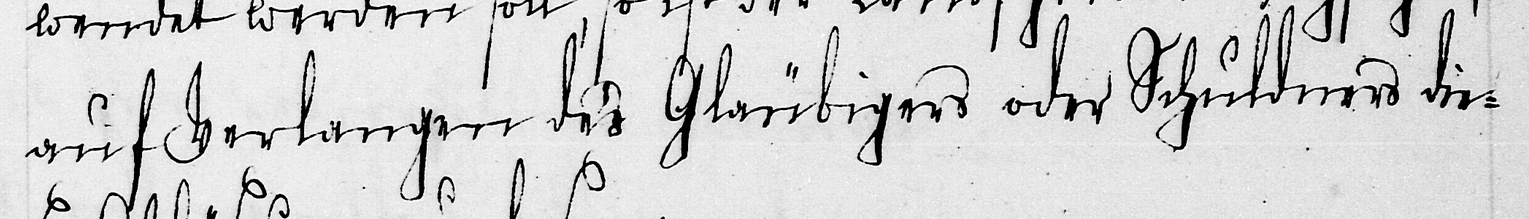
auf Verlangen des Gläubigers oder Schuldners die¬
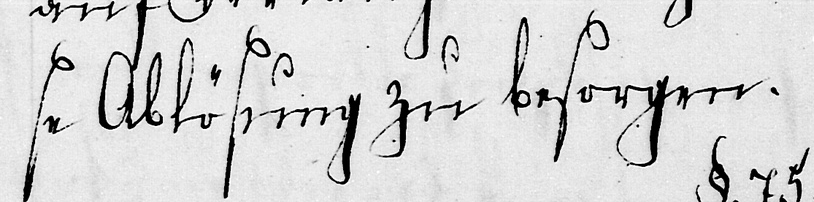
se Ablösung zu besorgen.
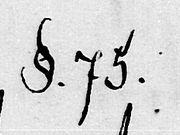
§. 75.
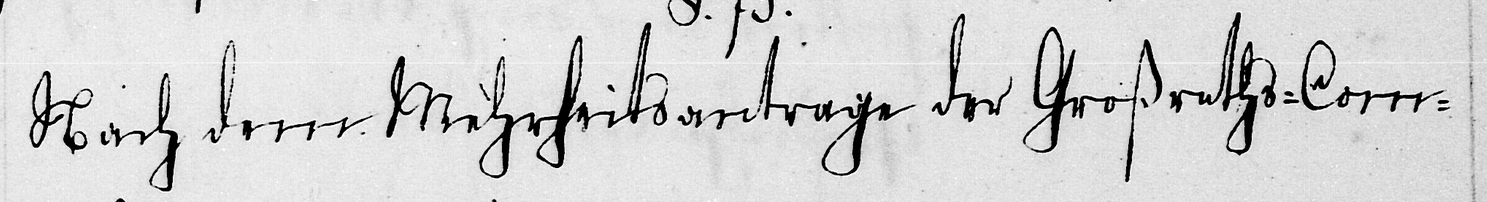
Nach dem Mehrheitsantrage der Großraths-Com¬
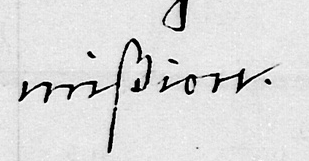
mißion.
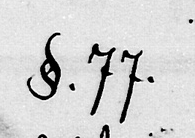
§. 77.
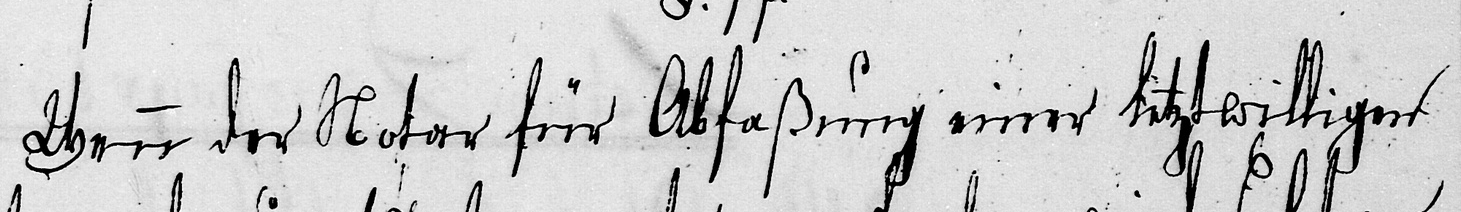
Wenn der Notar für Abfaßung einer letztwilligen
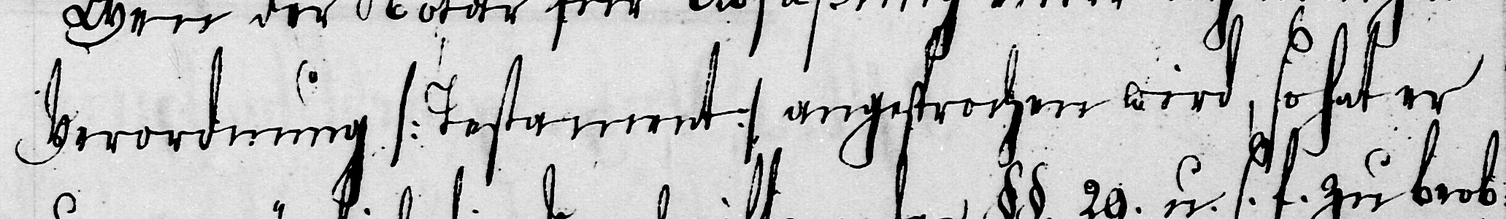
Verordnung [Testament] angesprochen wird, so hat er
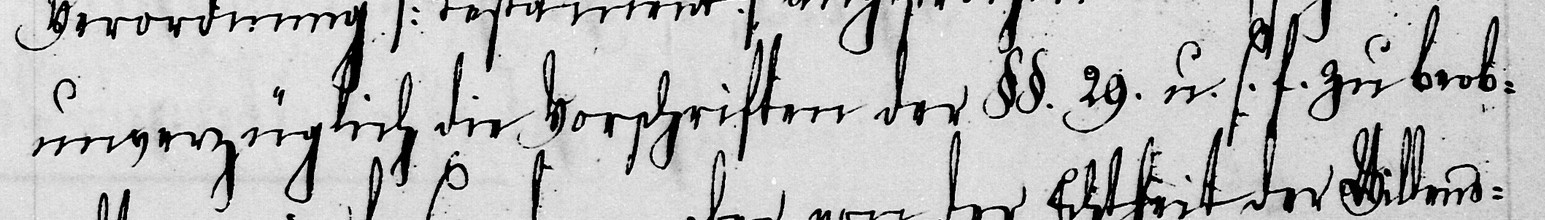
unverzüglich die Vorschriften der §§. 29. u. s. f. zu beob¬
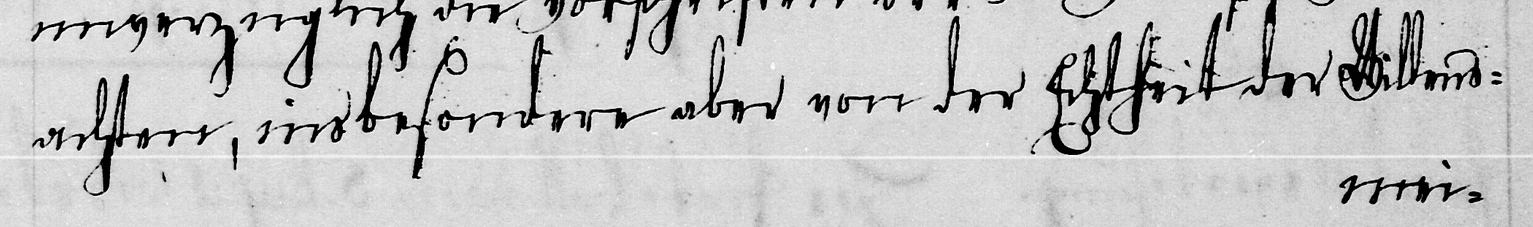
achten, insbesondere aber von der Echtheit der Willens-
